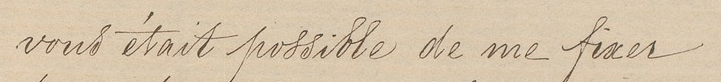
vous était possible de me fixer
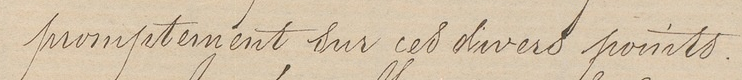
promptement sur ces divers points.
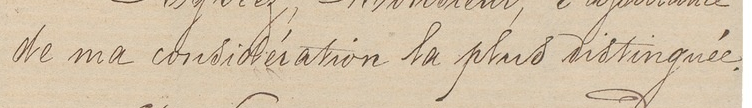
de ma considération la plus distinguée.
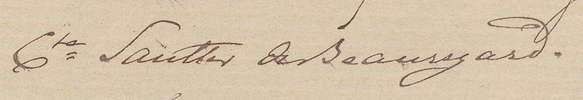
Cte Sautter de Beauregard.
